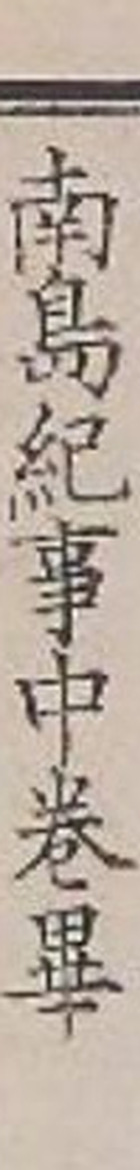南島紀事中巻畢
